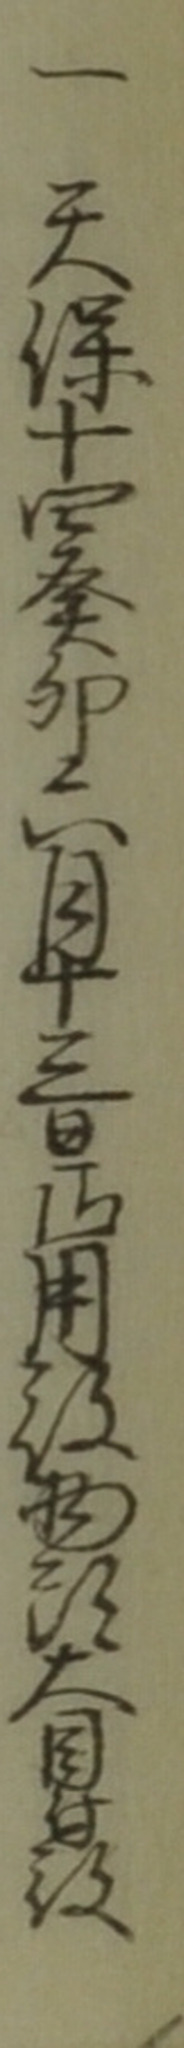一天保十四癸卯六月十三日御用役物頭大目付役
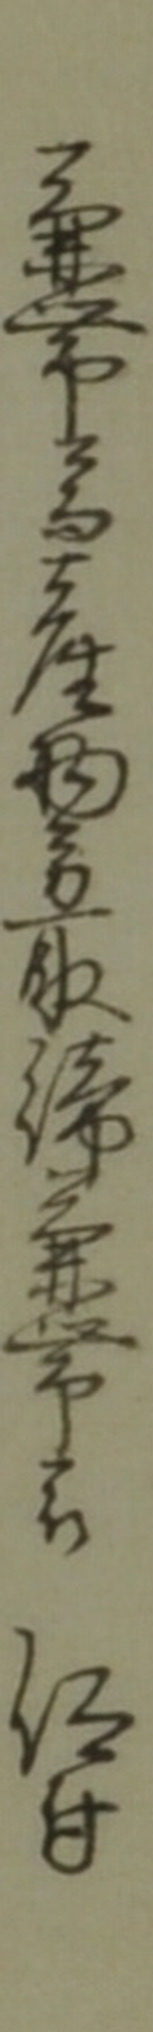兼帯ニ而産物方取締兼帯被仰付
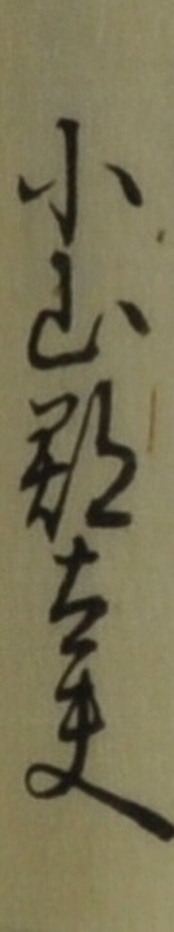小山郡太夫
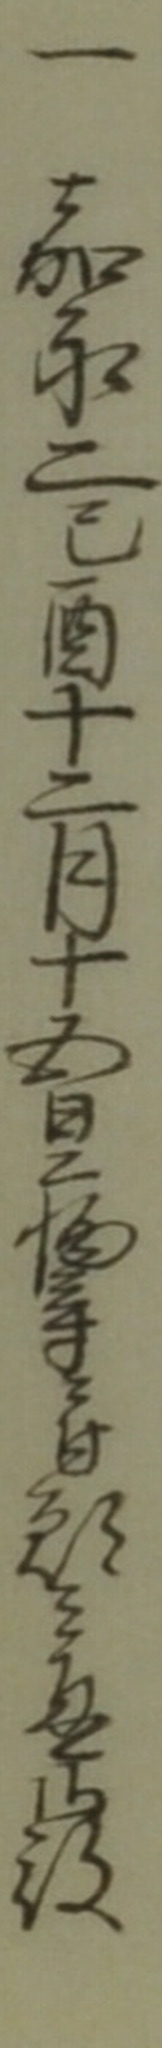一嘉永二己酉十二月十五日病気ニ付願之通御役
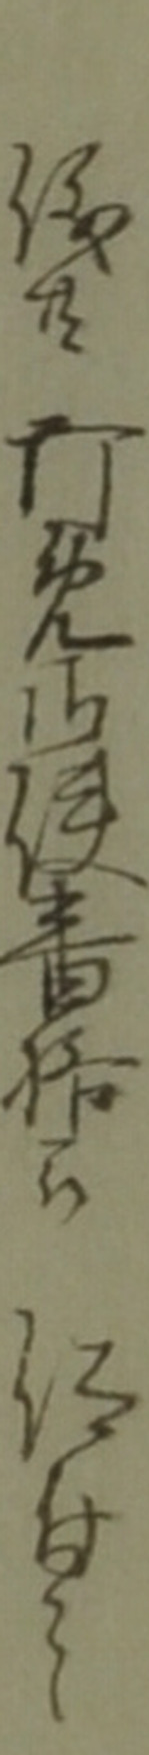儀共御免御使番格被仰付之
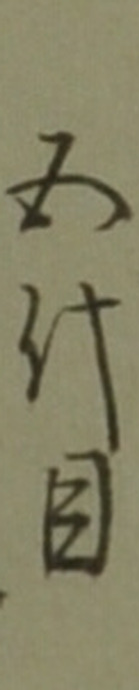五代目
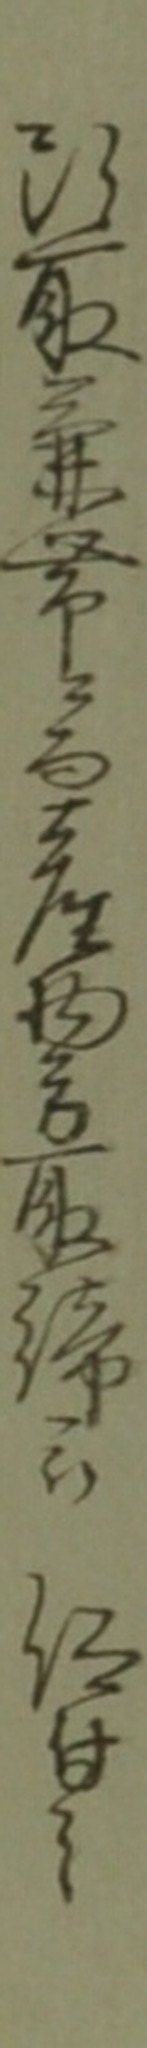頭取兼帯ニ而産物方取締被仰付之
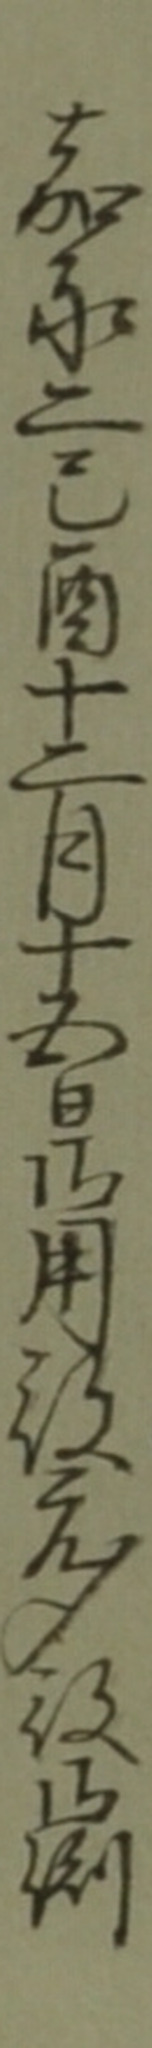一嘉永二己酉十二月十五日御用役元〆役御側
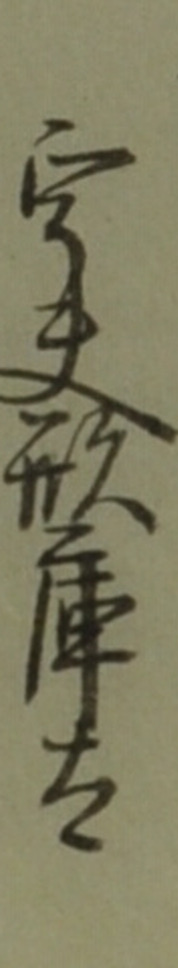宇夫形庫太
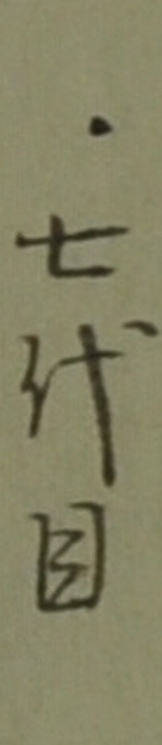七代目
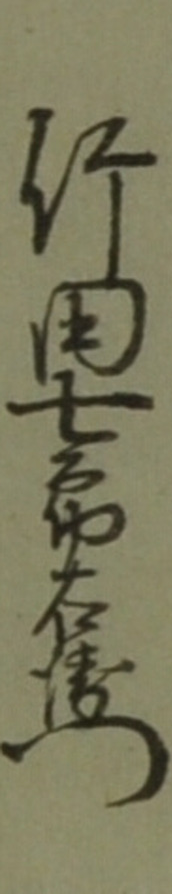竹田七郎右衛門
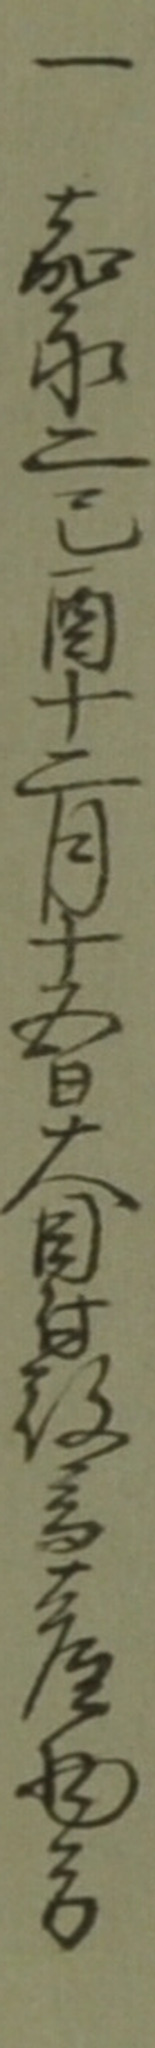一嘉永二己酉十二月十五日大目付役ニ而産物方
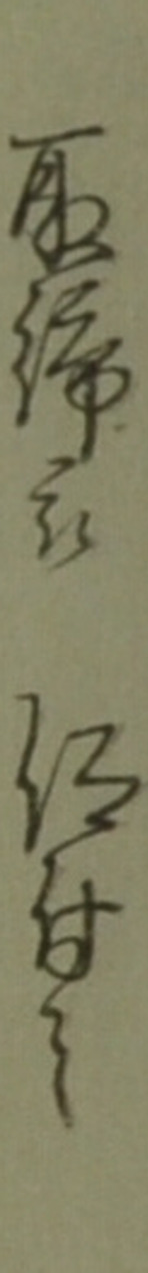取締被仰付之
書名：諸御役代々録（三）
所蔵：伊那市立高遠町図書館・合同会社AMANE
